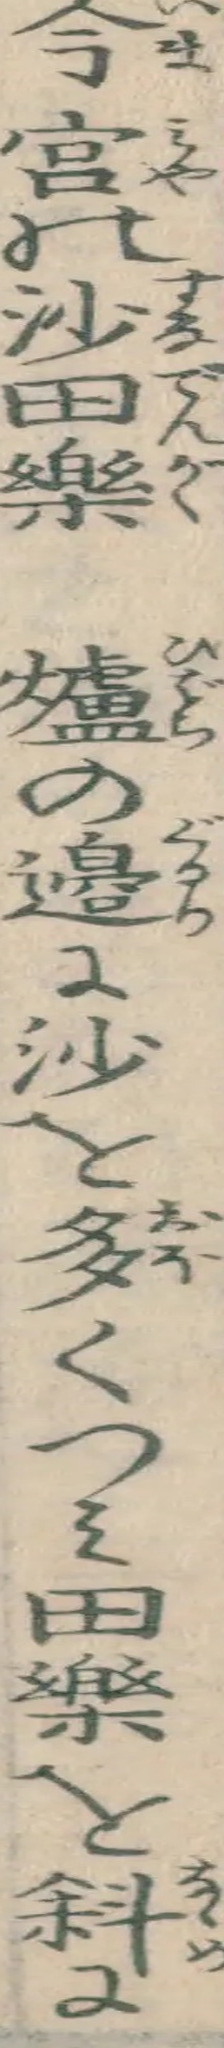六今宮の沙田楽炉の辺に沙を多くつみ田楽を斜に
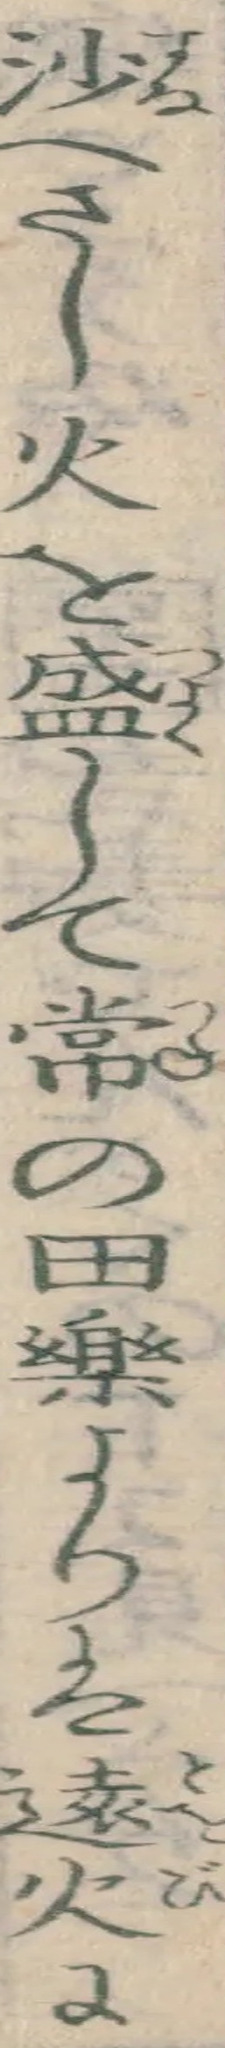沙へさし火を盛して常の田楽よりは遠火に
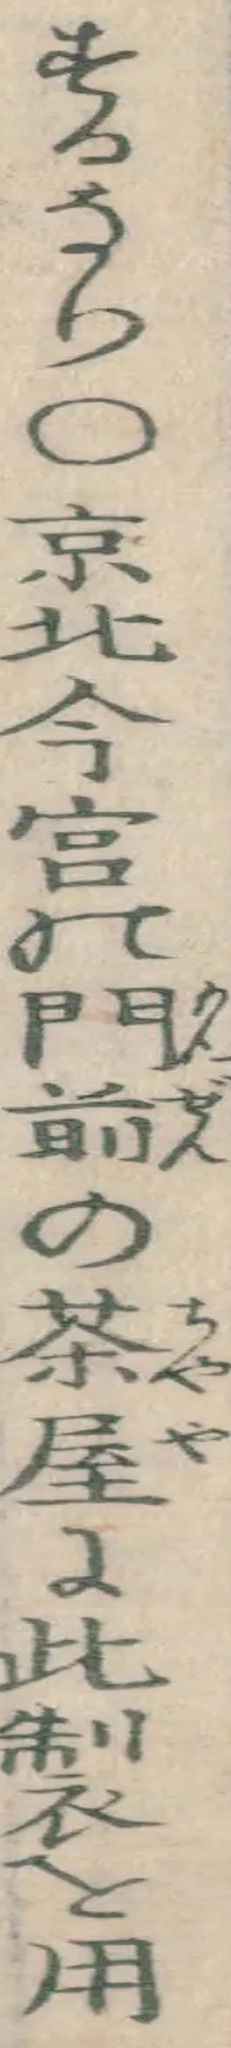するなり○京北今宮の門前の茶屋に此製を用
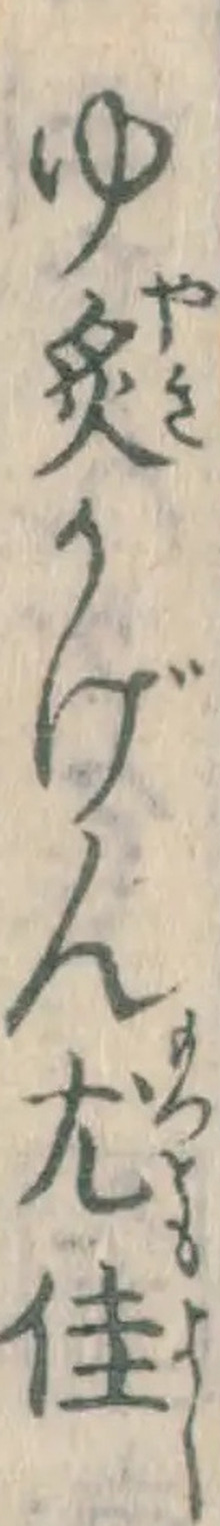ゆ炙かげん尤佳
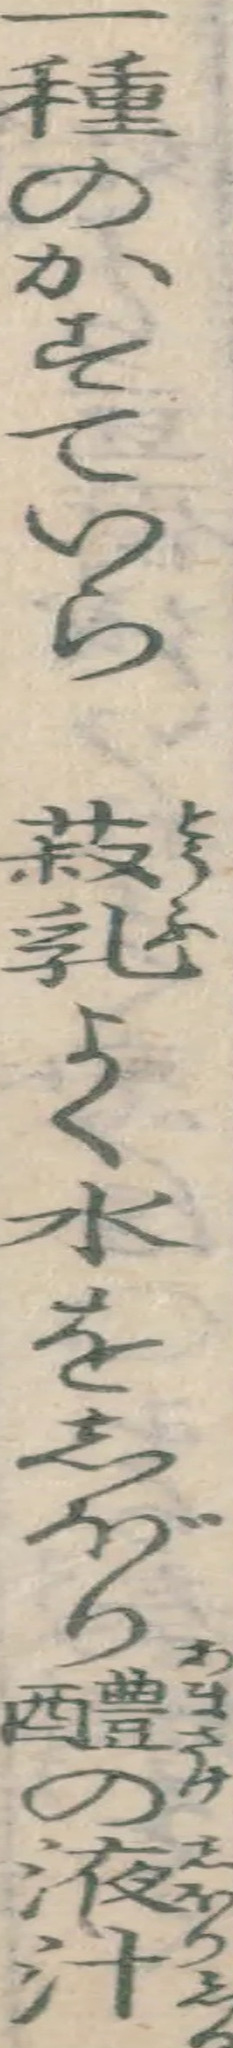七一種のかすていら菽乳よく水をしぼり醴の液汁
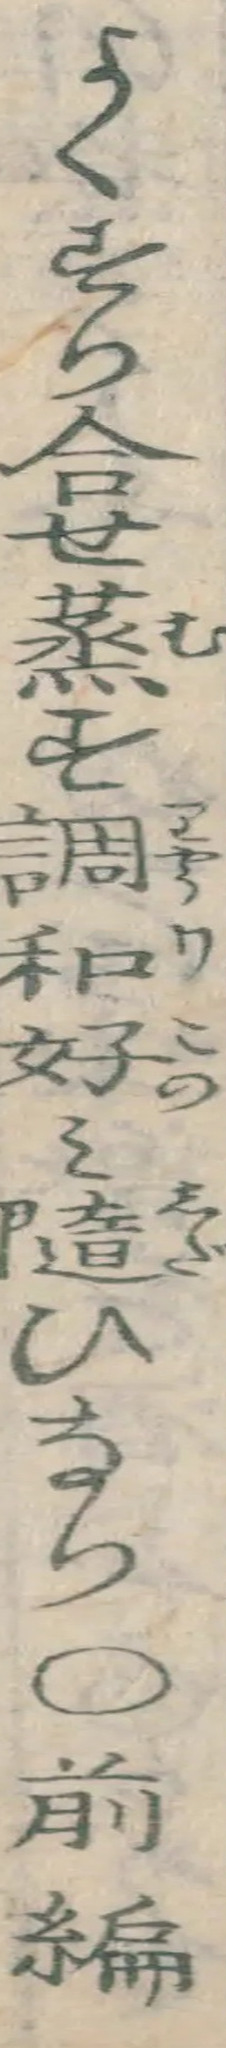よくすり合せ蒸す調和好み随ひなり○前編

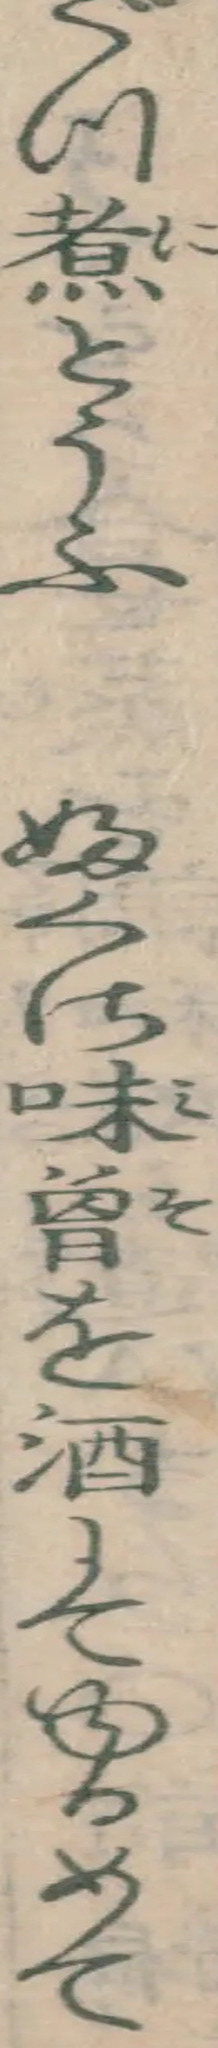九ぐつ煮とうふふくさ味曽を酒にてゆるめて
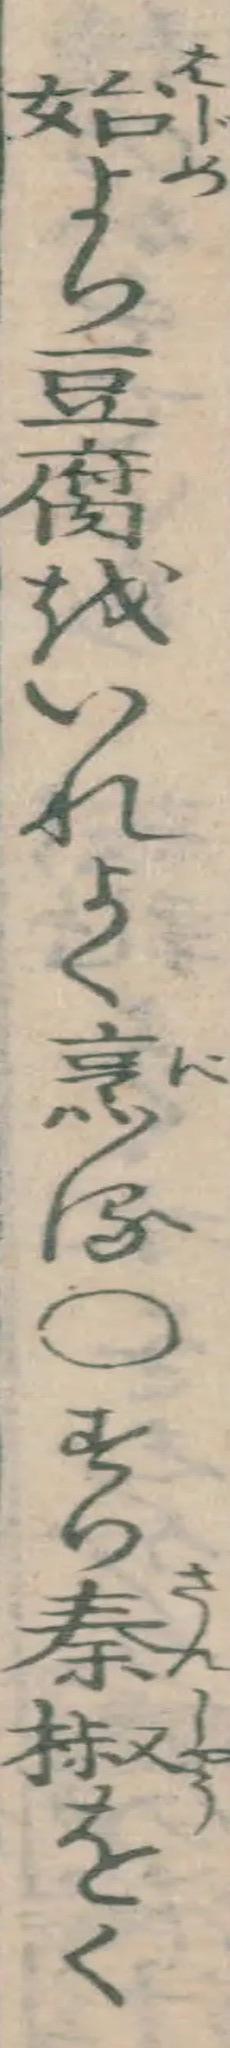始より豆腐をいれよく烹る○すり秦椒をく
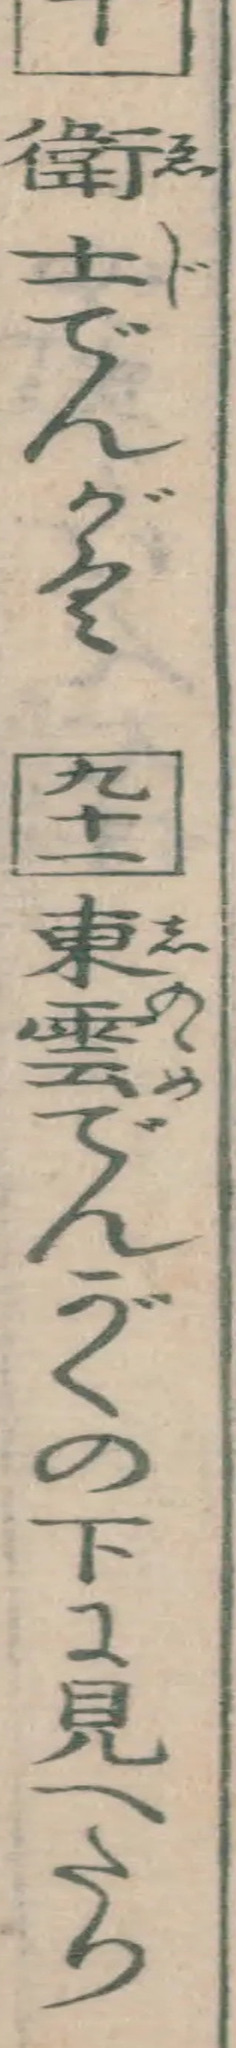十衛士でんがく九十一東雲でんがくの下に見へたり
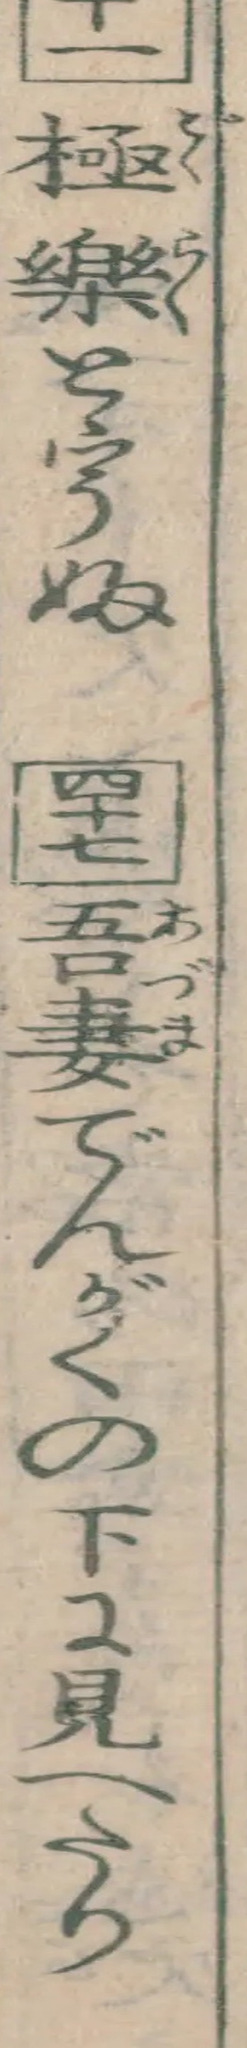十一極楽とうふ四十七吾妻でんがくの下に見へたり
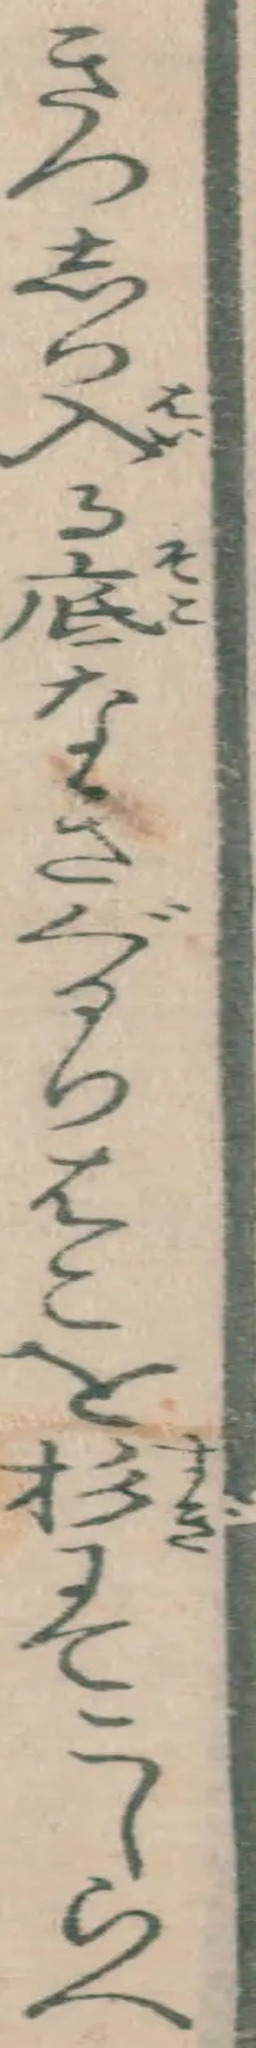きつしり入る底なきぐるりはこを杉にてこしらへ
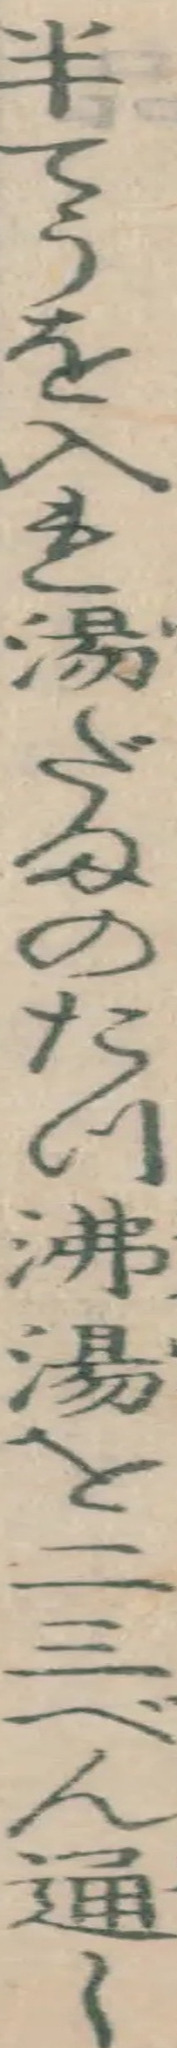半てうを入れ湯だまのたつ沸湯を二三べん通し
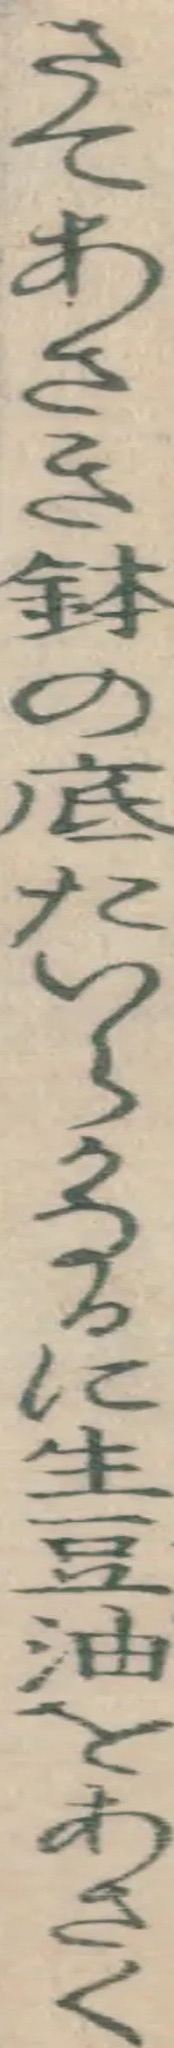さてあさき鉢の底たいらかなるに生豆油をあさく
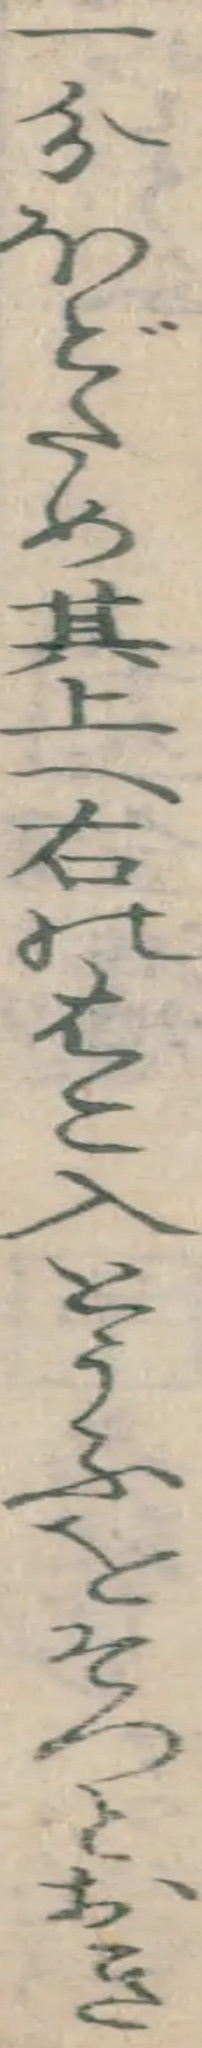一分ほどため其上へ右のはこ入とうふをそつとおき
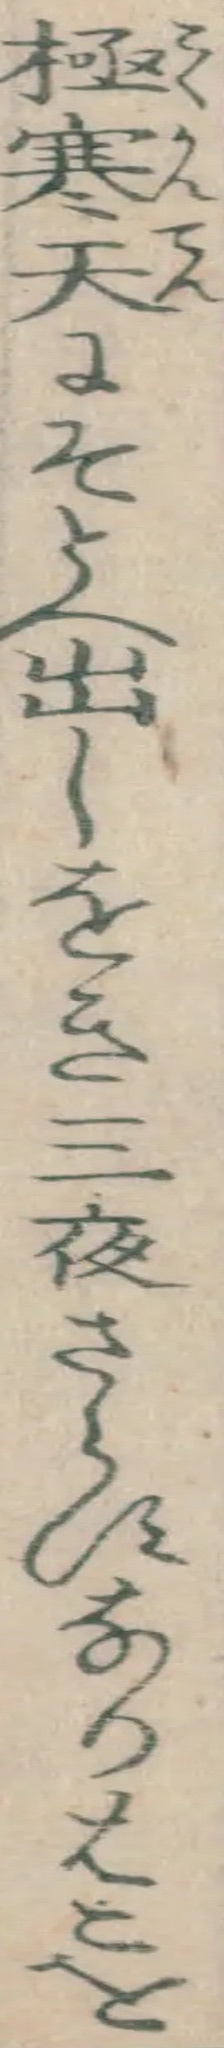極寒天にそとへ出しをき三夜さらすなりはこを
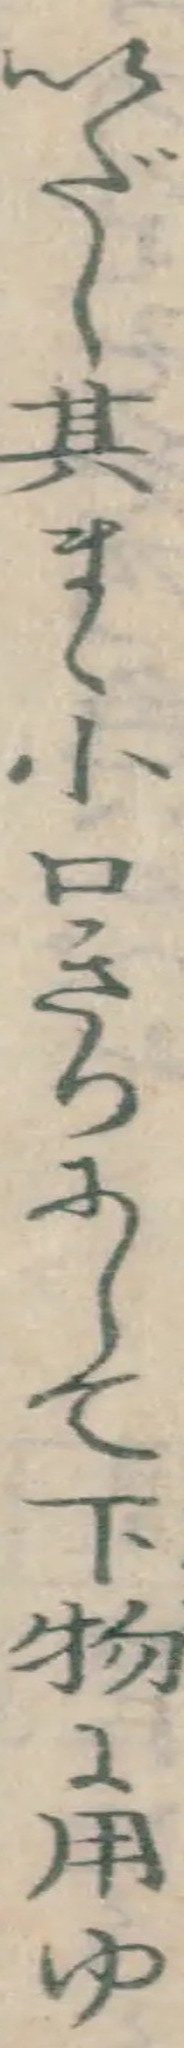いだし其まゝ小口きりにして下物に用ゆ
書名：豆腐百珍. 続編
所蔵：国立国会図書館 National Diet Library, JAPAN
